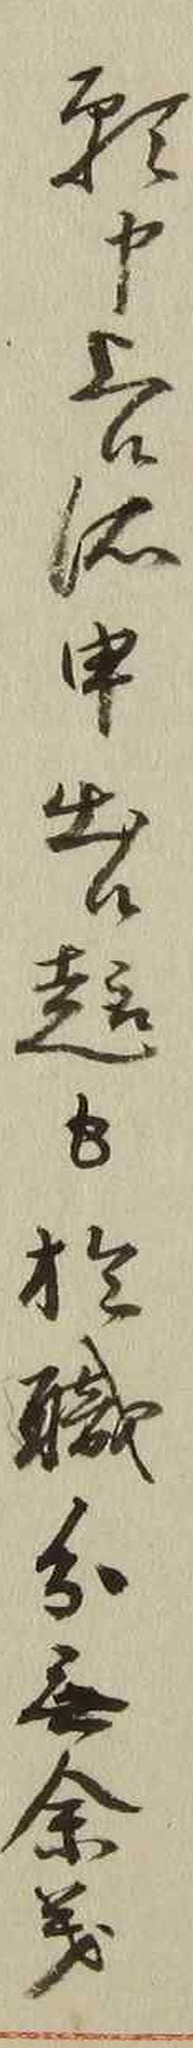願申上候処申出候趣も於職分無余儀
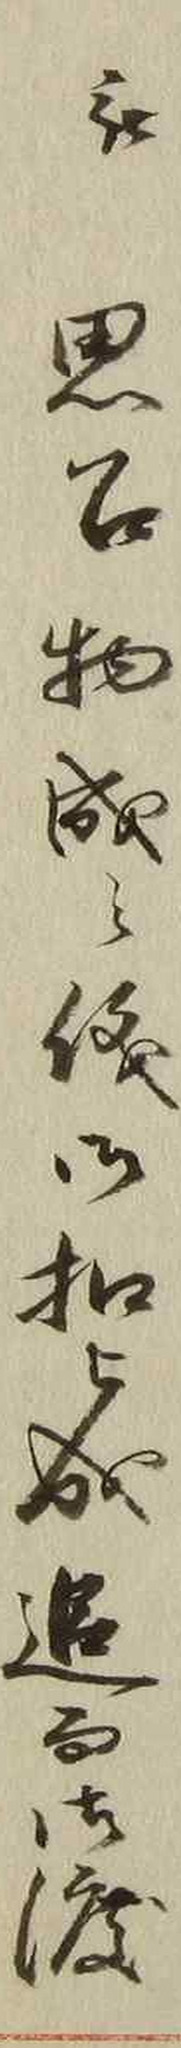被思召物成之儀御扣被成追而御渡
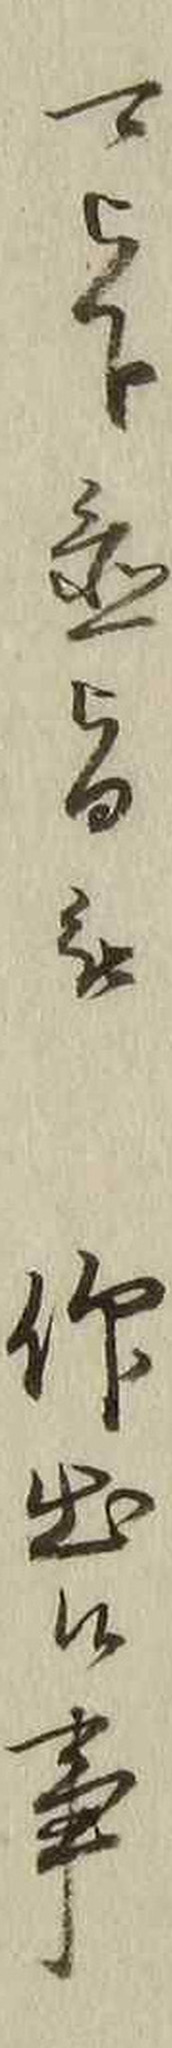可被下置旨被仰出候事
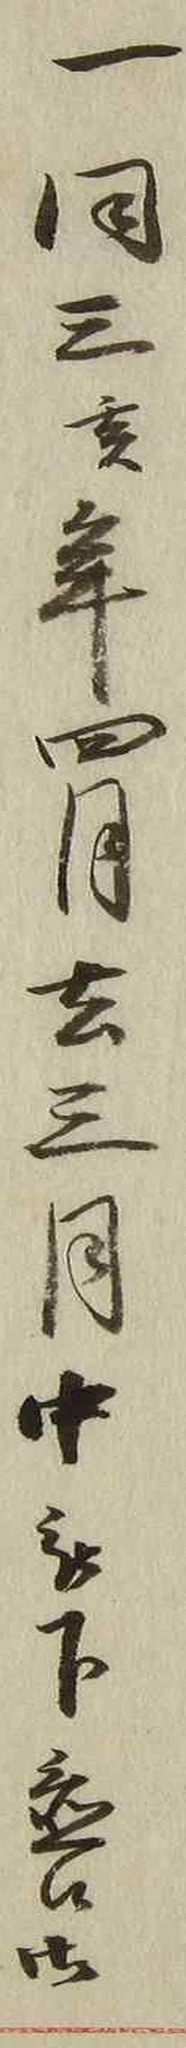一同三亥年四月去三月中被下置候御
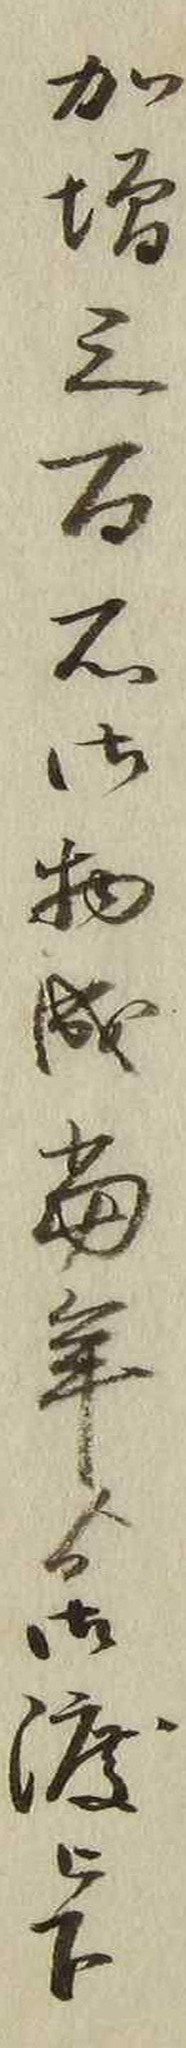加増三百石御物成当年ゟ御渡被下
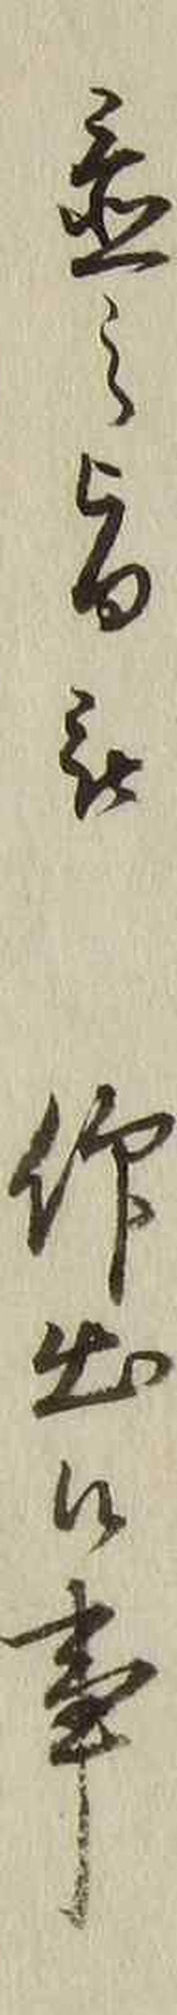置候旨被仰出候事
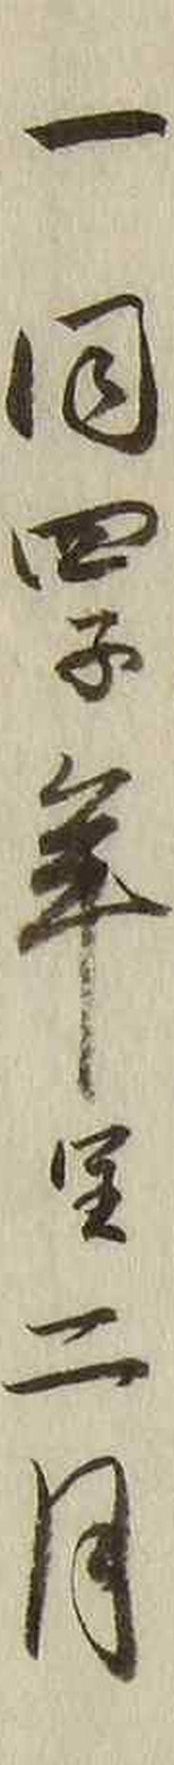一同四子年閏二月
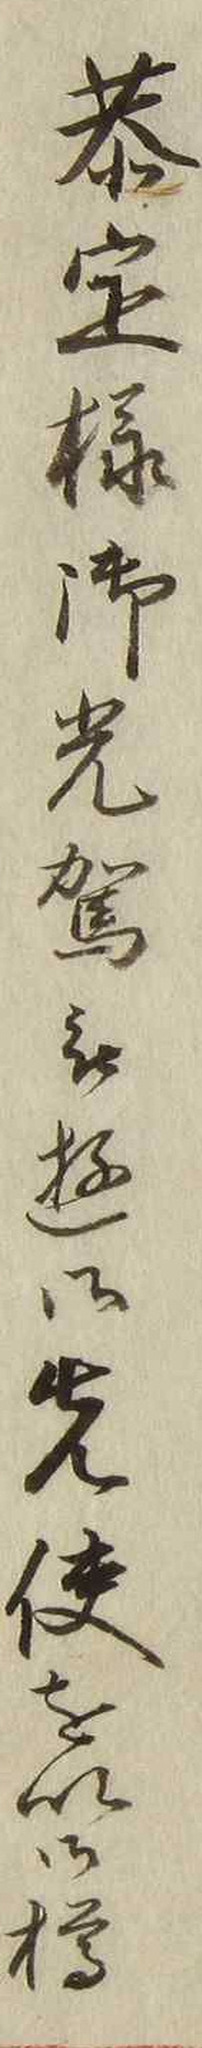恭定様御光駕被遊御先使を以御樽
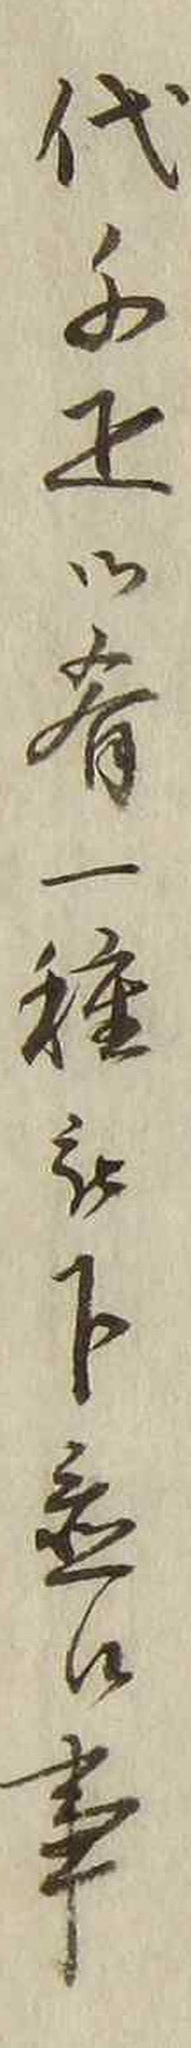代千疋御肴一種被下置候事

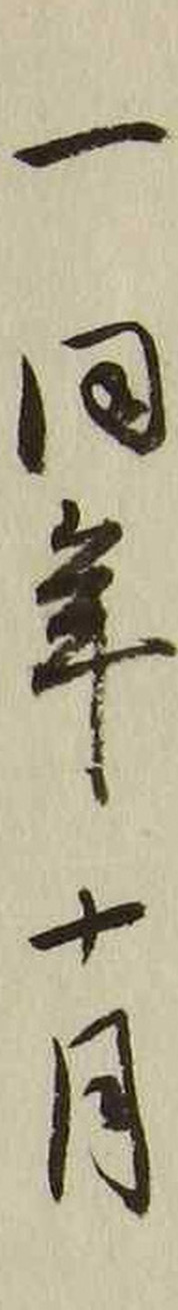一同年十月
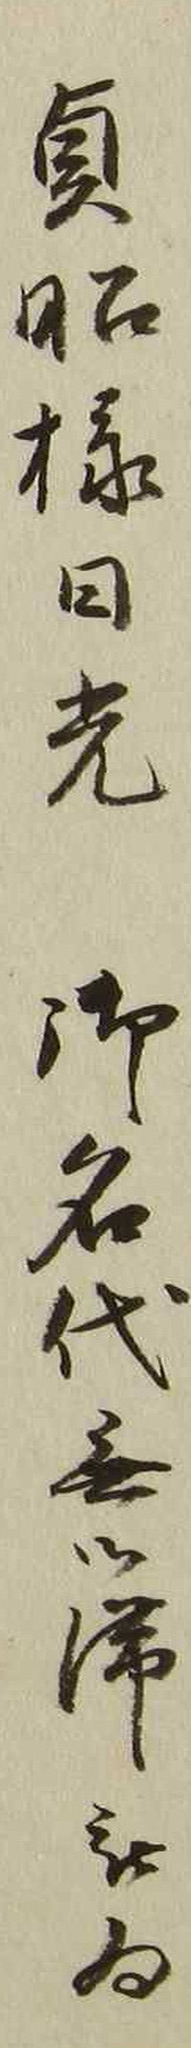貞昭様日光御名代無御滞被為
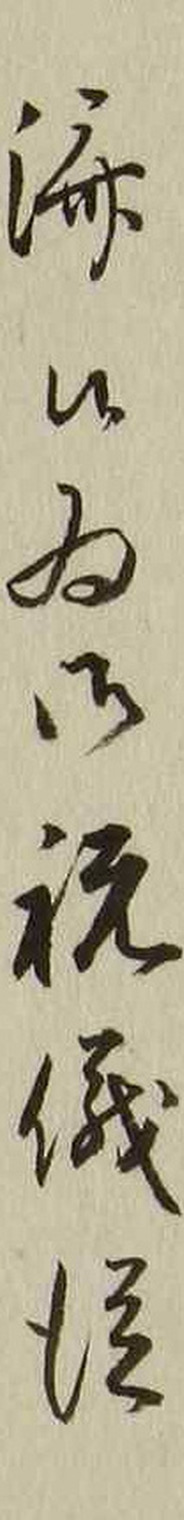済候為御祝儀従
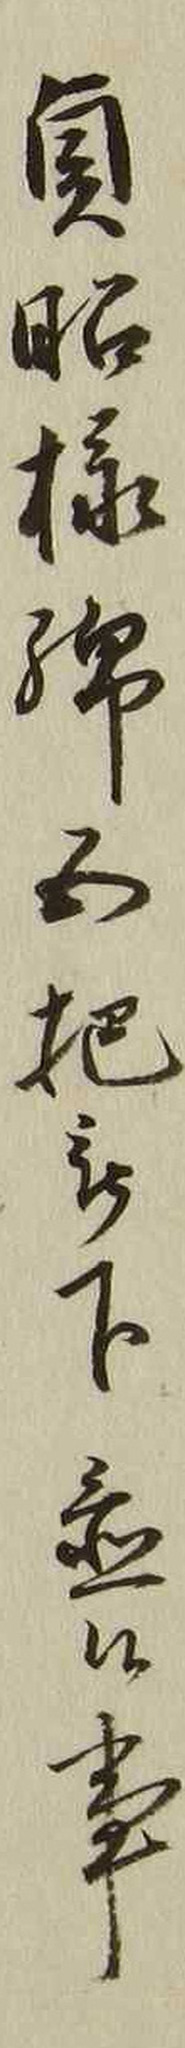貞昭様綿五把被下置候事
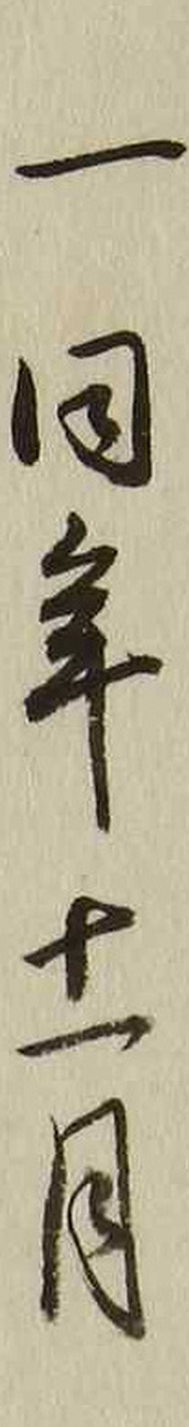一同年十一月
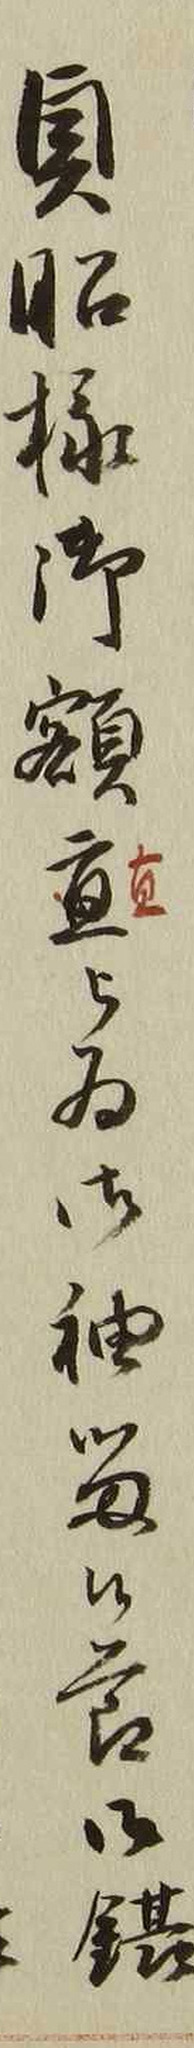貞昭様御額宣被為御袖留候節御錯
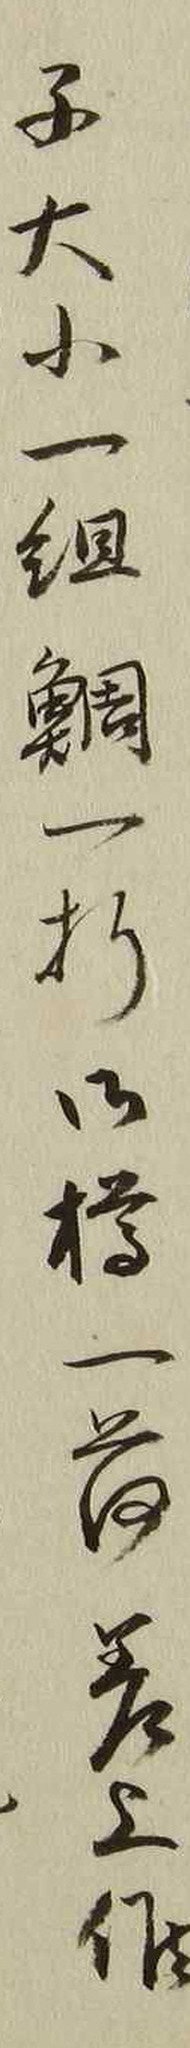子大小一組鯛一折御樽一荷差上候
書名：諸士系譜　巻之125　た之部1
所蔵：会津若松市立会津図書館
